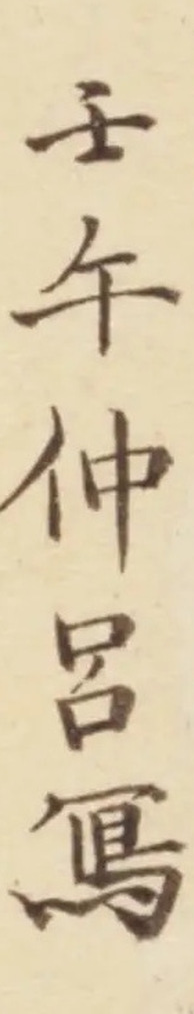壬午仲呂寫
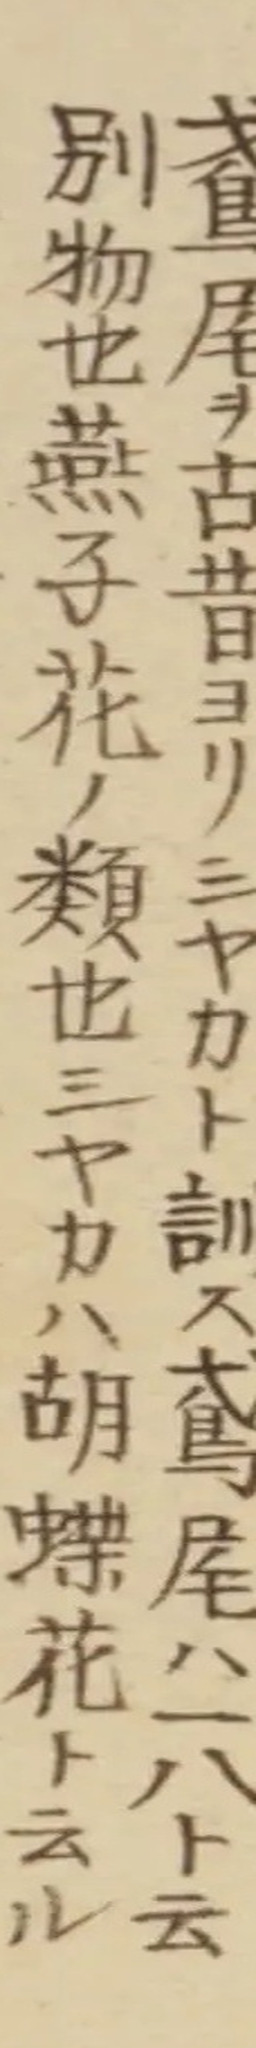別物也燕子花の類也しやかは胡蝶花と云る

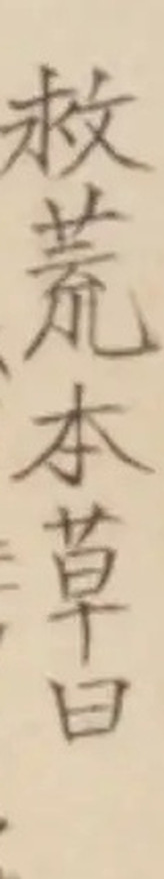救荒本草曰
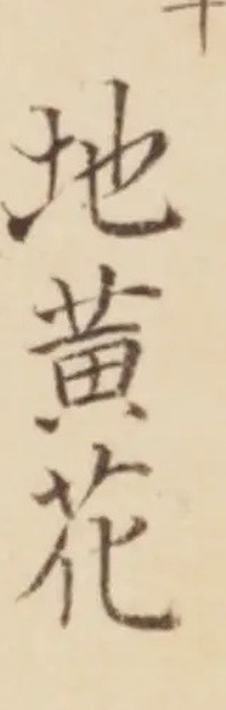地黄苗
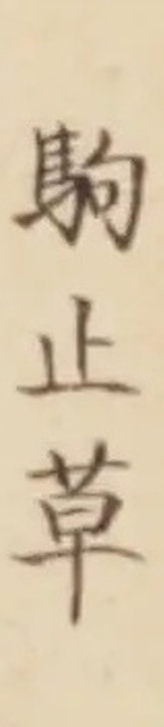駒止草
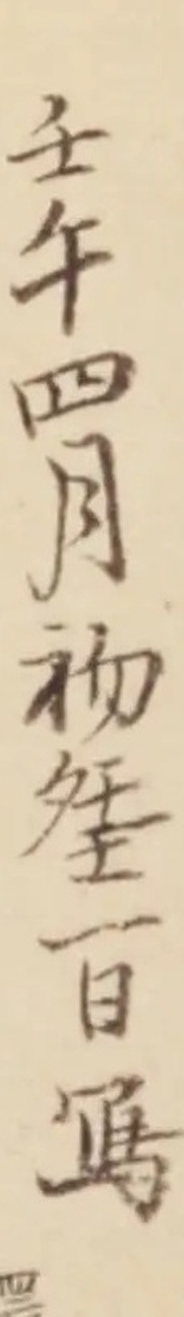壬午四月初一日寫
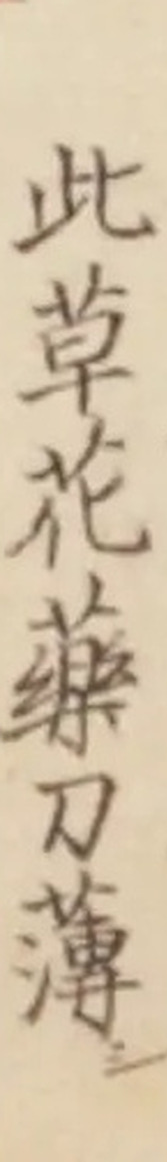此草花薬刀薄し
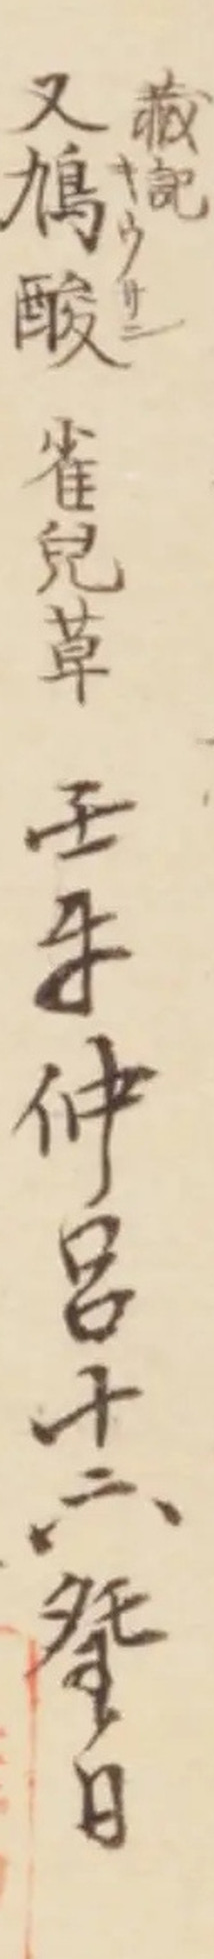又鳩酸雀兒草壬午仲呂十二日
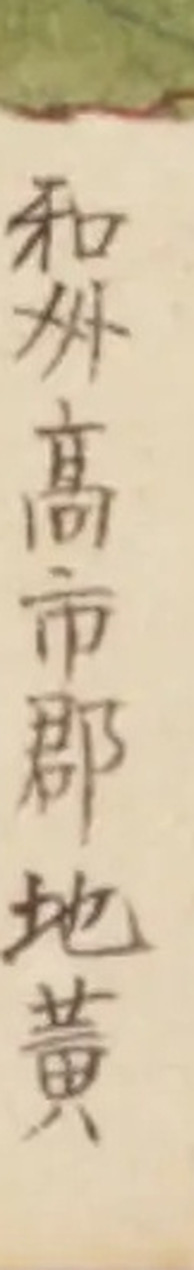和外高市郡地黄
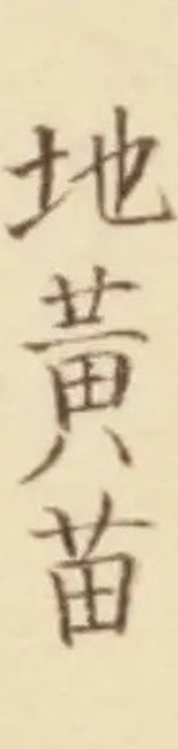地黄苗
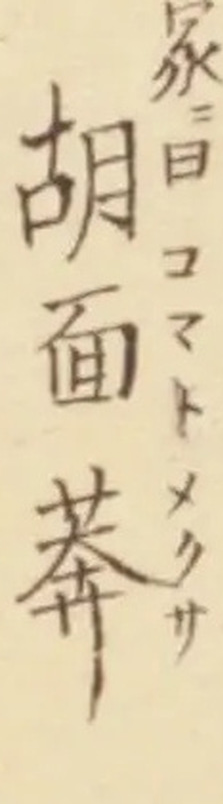胡面莾
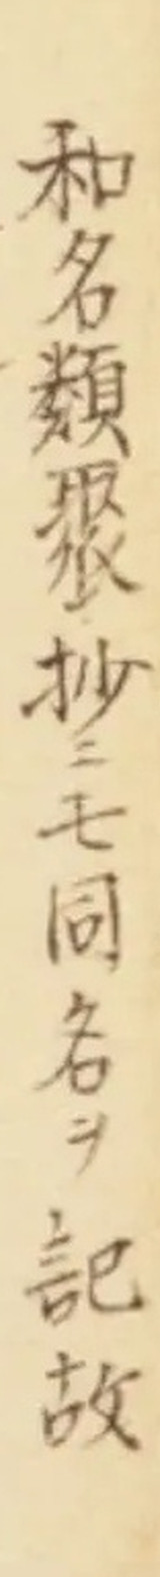和名類聚抄にも同名を記故
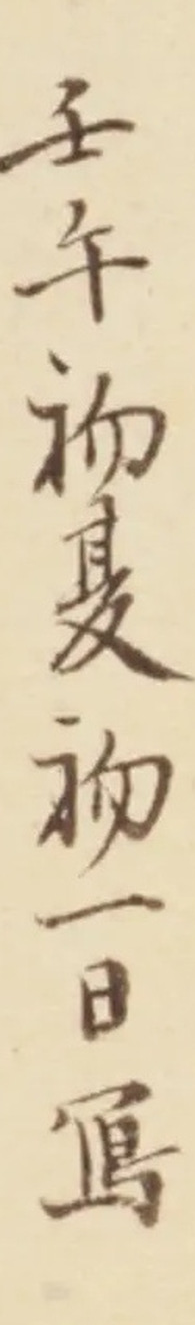壬午初夏初一日寫

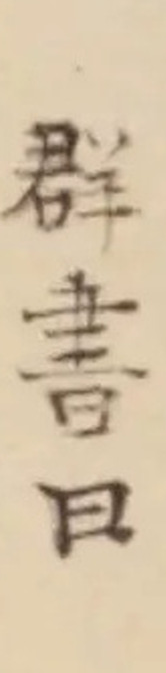群書曰
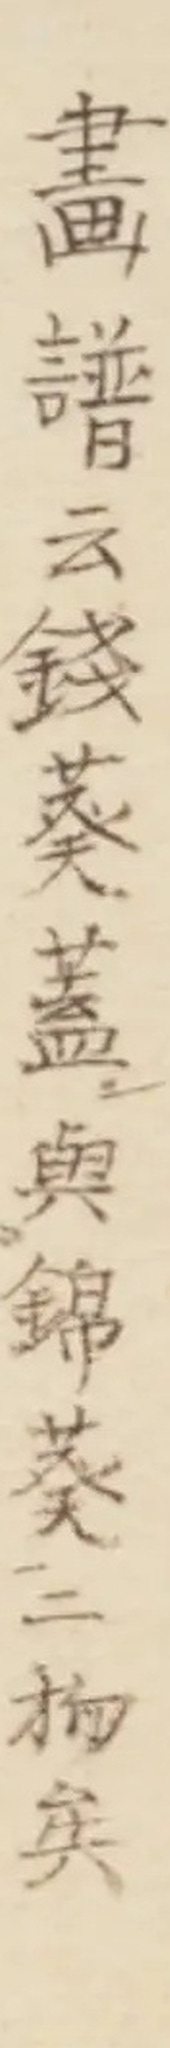画譜云錢葵蓋し與錦葵二物矣
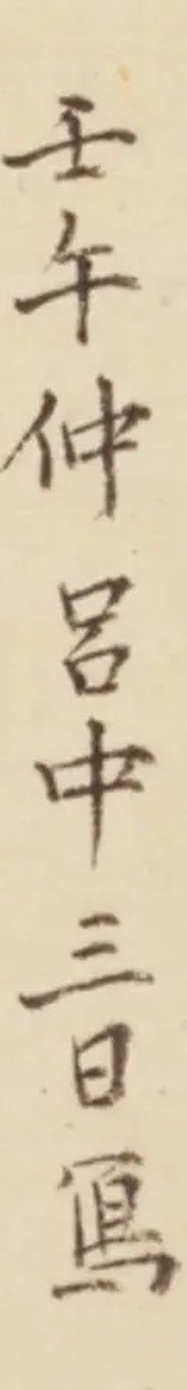壬午仲呂中三日寫
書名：梅園草木花譜夏之部. 1
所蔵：国立国会図書館 National Diet Library, JAPAN
